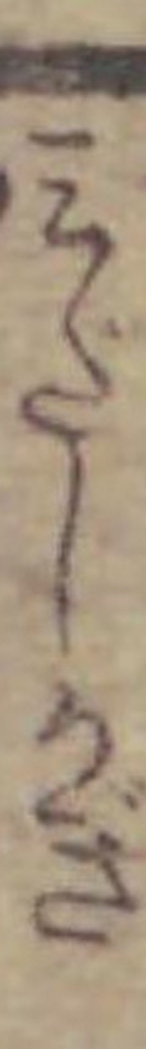みだしかぎ
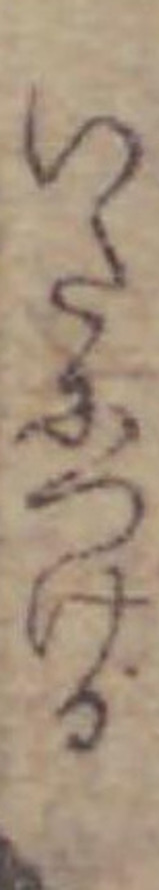いたにつける
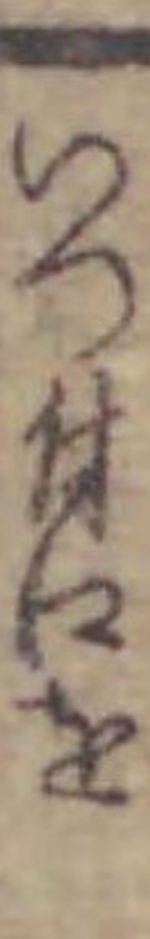いつ付口を
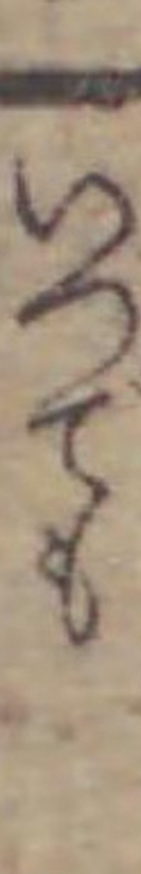いつでも
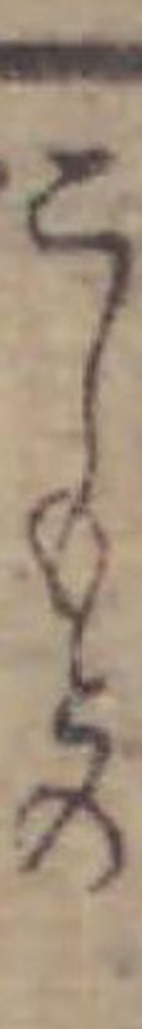こしもとの
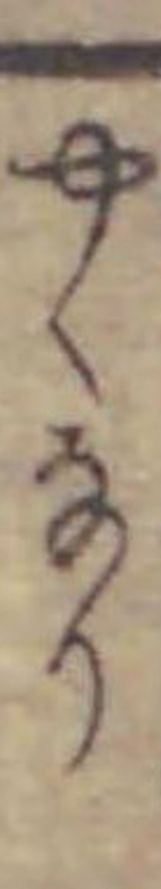やくなり
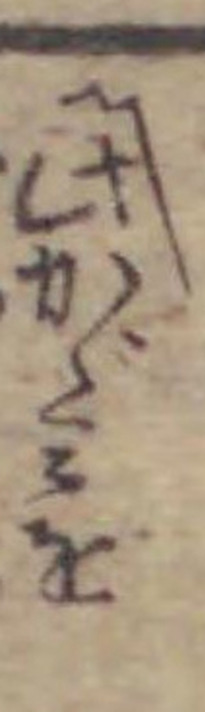「此かゞみを
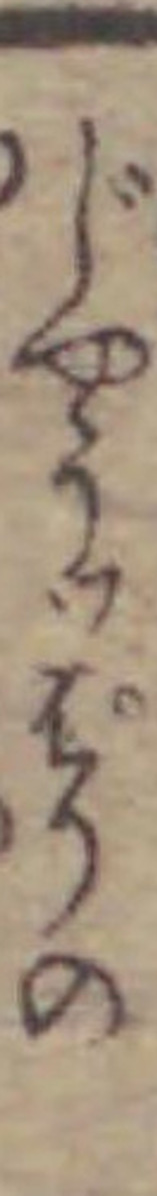じやうッぱりの
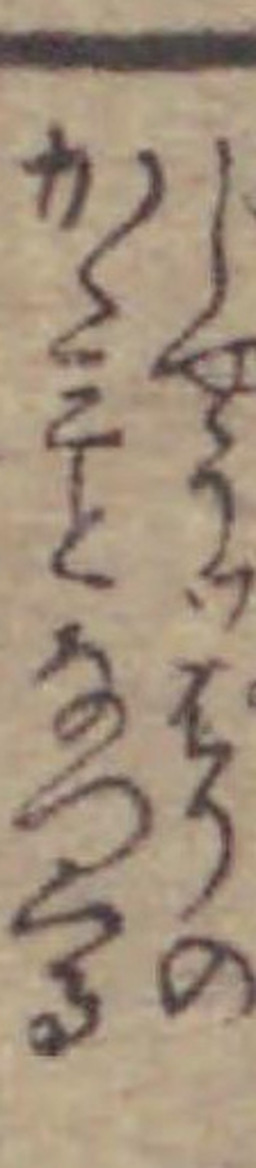かゝみとなつくる
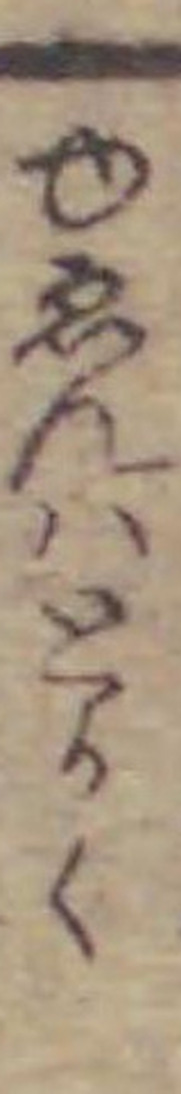ゆゑんはとかく
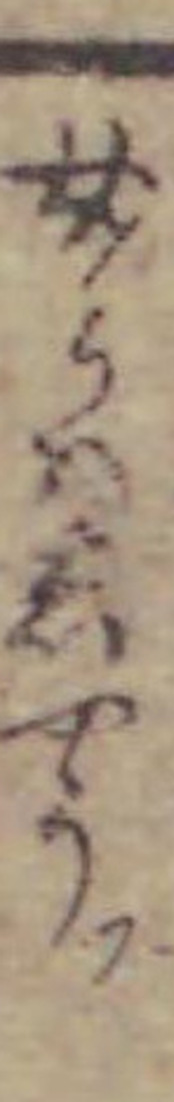女郎はしやうッ
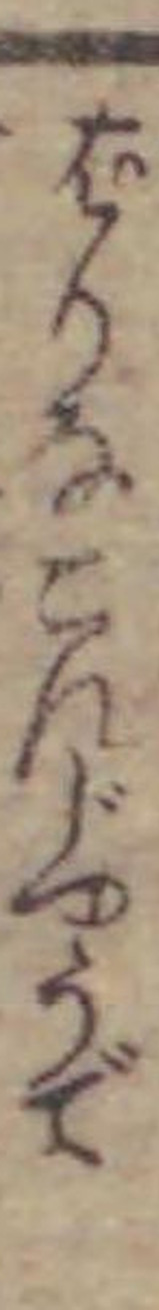ぱりなこんじやうで
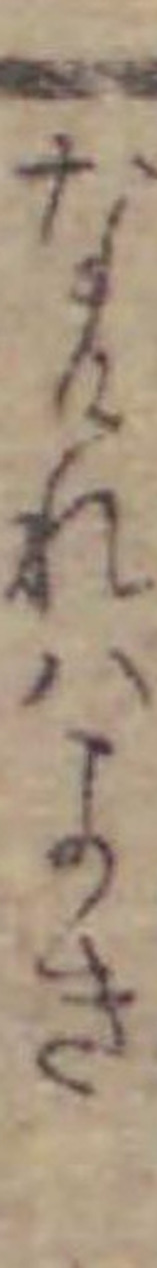なけれはよき
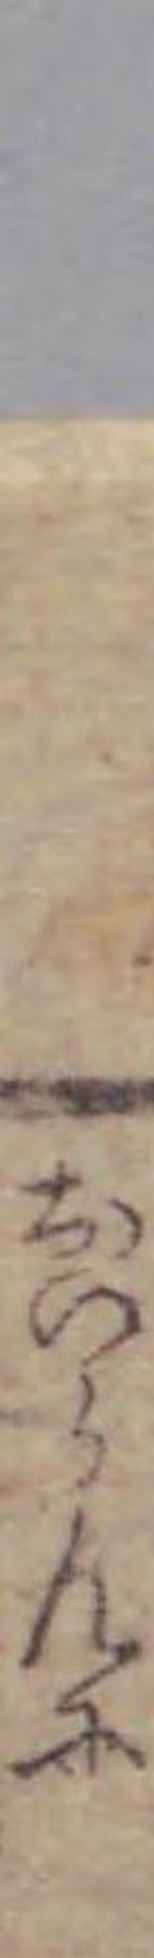おいらんに
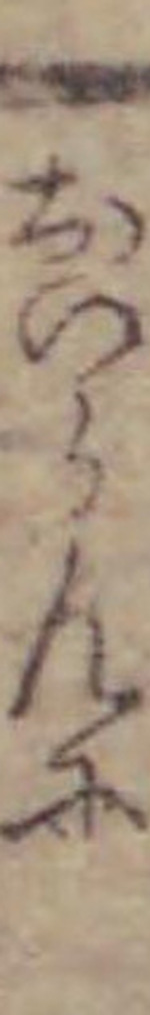おいらんに
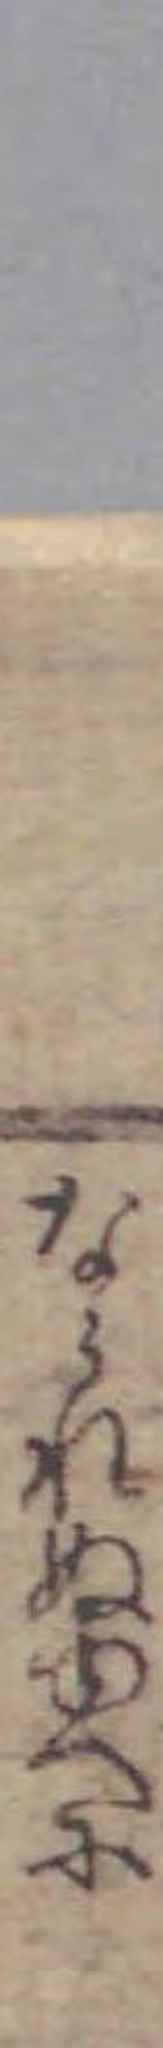なられぬゆへに
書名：九替十年色地獄 : 3巻
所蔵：国立国会図書館 National Diet Library, JAPAN
